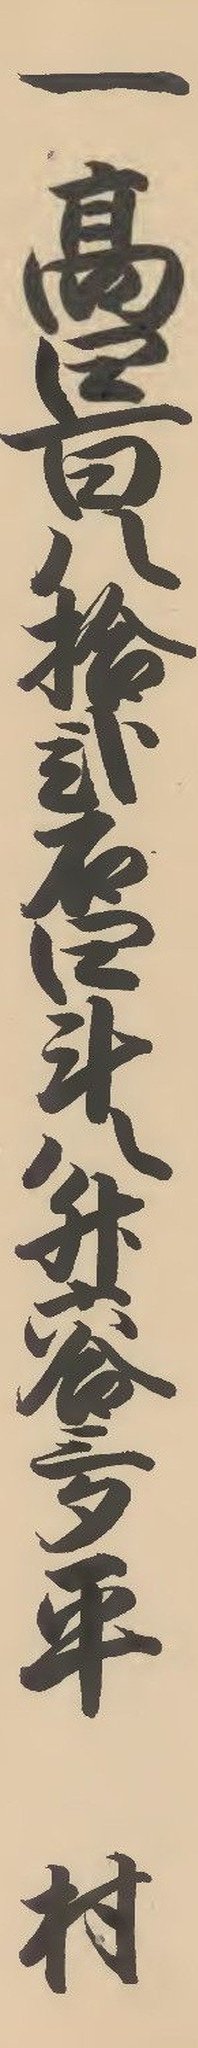一髙四百八拾弐石四斗八升六合三夕平村
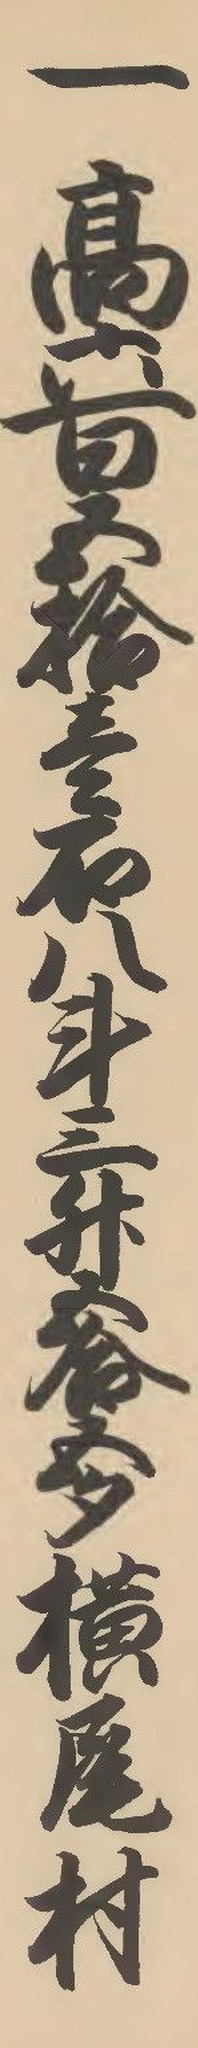一髙六百五拾壱石八斗三升五合五夕横尾村
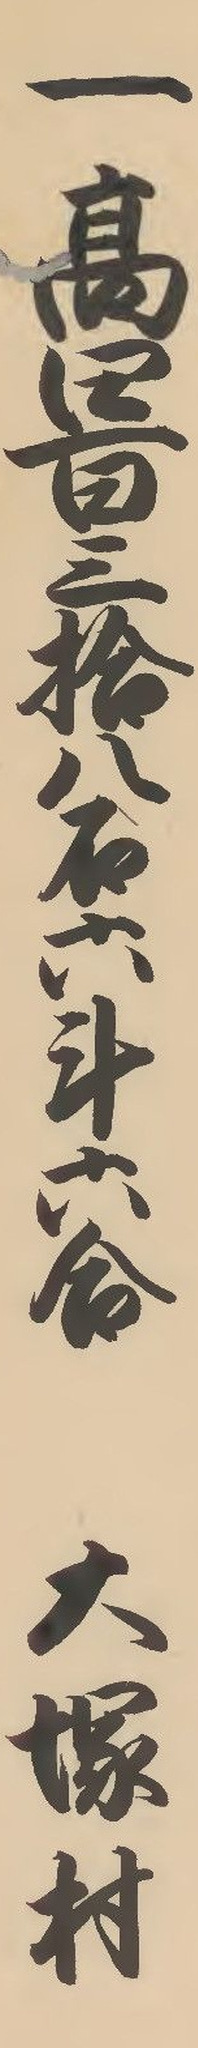一髙四百三拾八石六斗六合大塚村

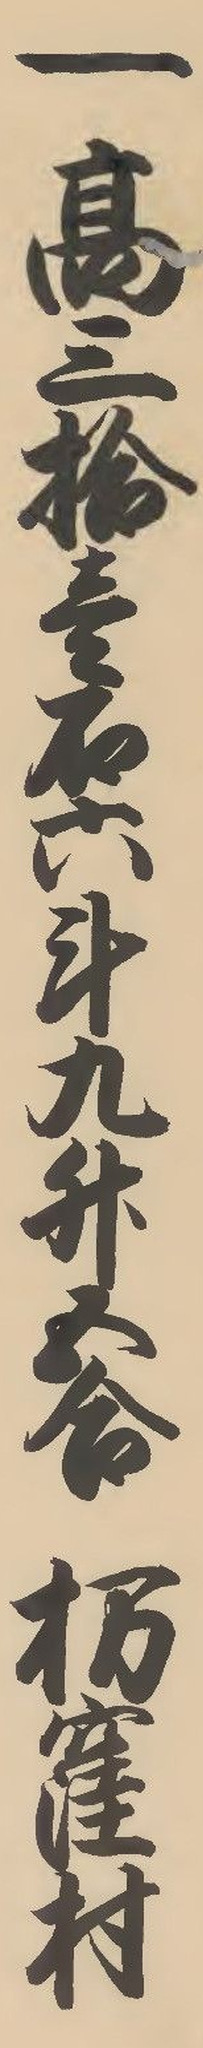一髙三拾壱石六斗九升五合杤窪村
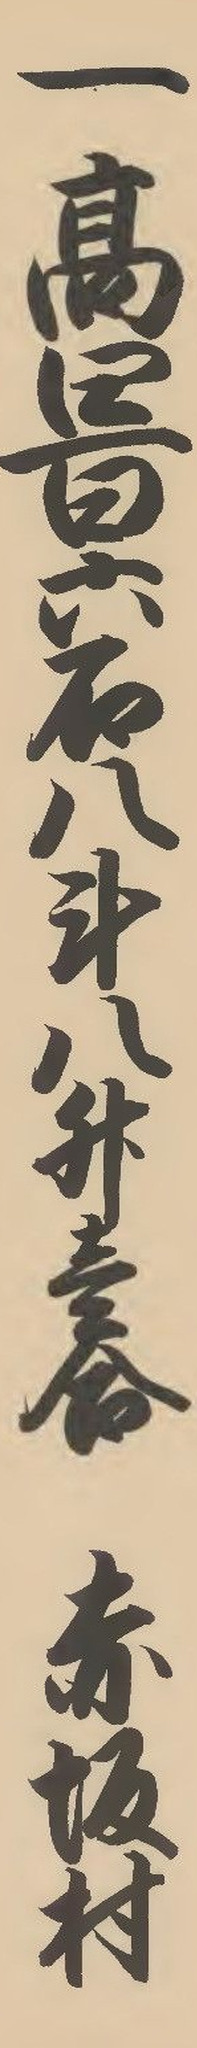一髙四百六石八斗八升壱合赤坂村
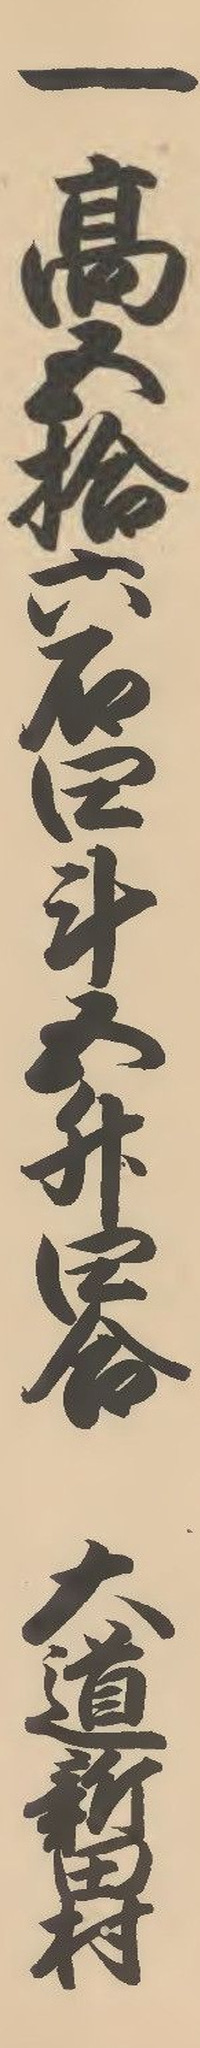一髙五拾六石四斗五升四合大道新田村
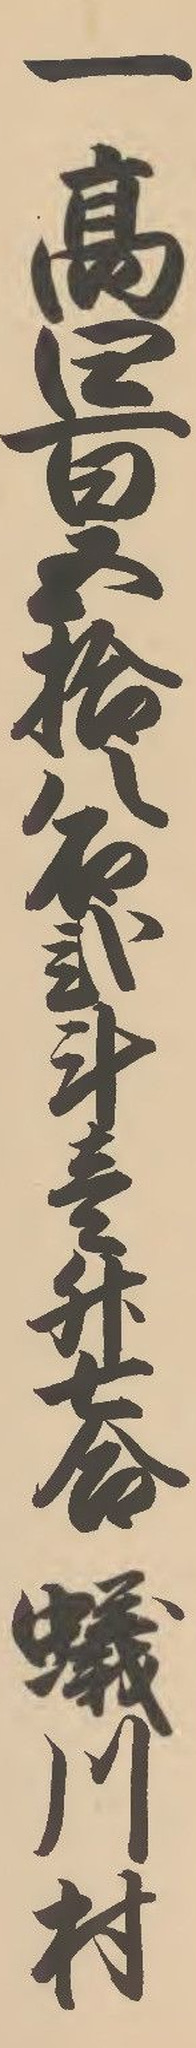一髙四百五拾八石弐斗壱升七合蟻川村
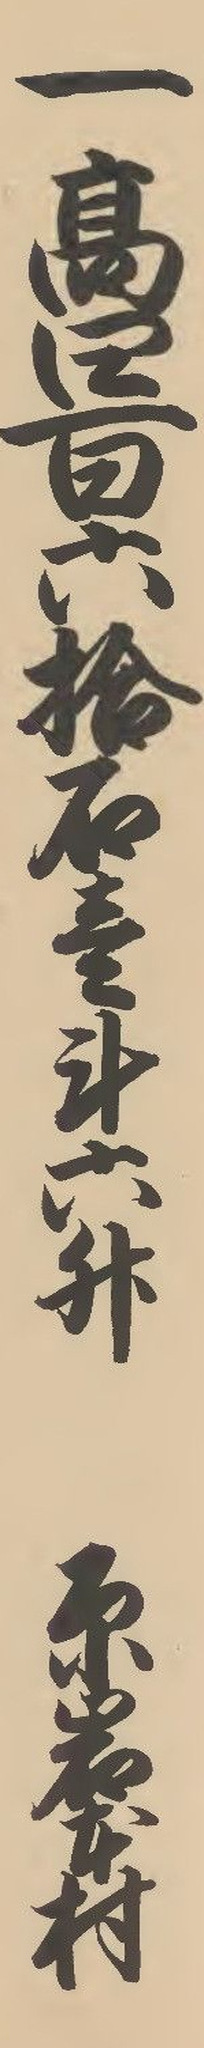一髙四百六拾石壱斗六升原岩本村
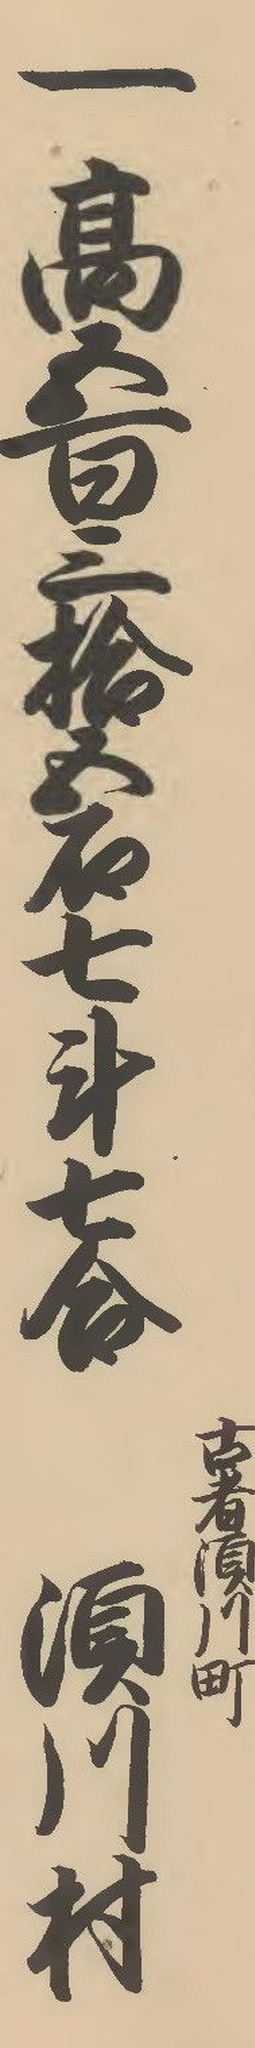一髙五百三拾五石七斗七合須川村
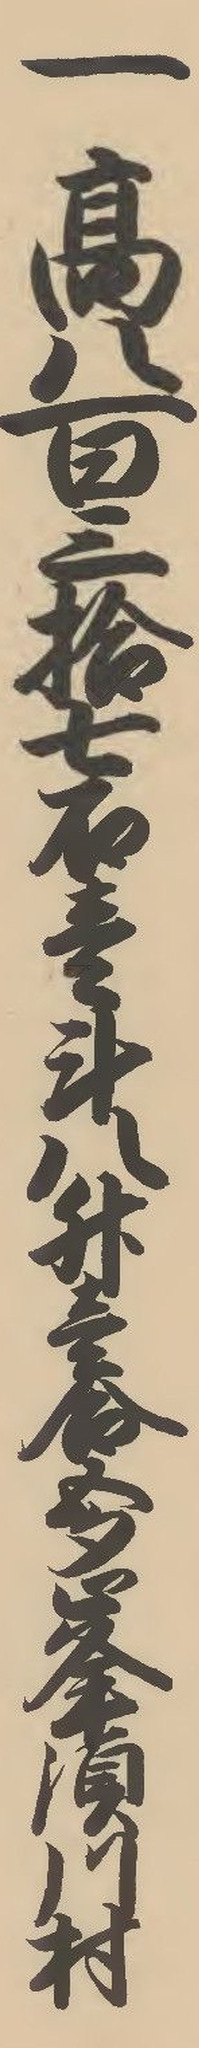一髙八百三拾七石壱斗八升壱合五夕峯須川村
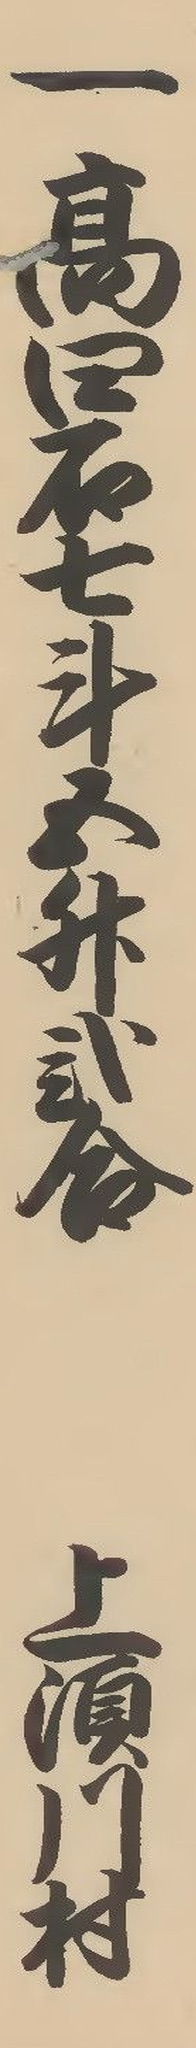一髙四石七斗五升弐合上須川村

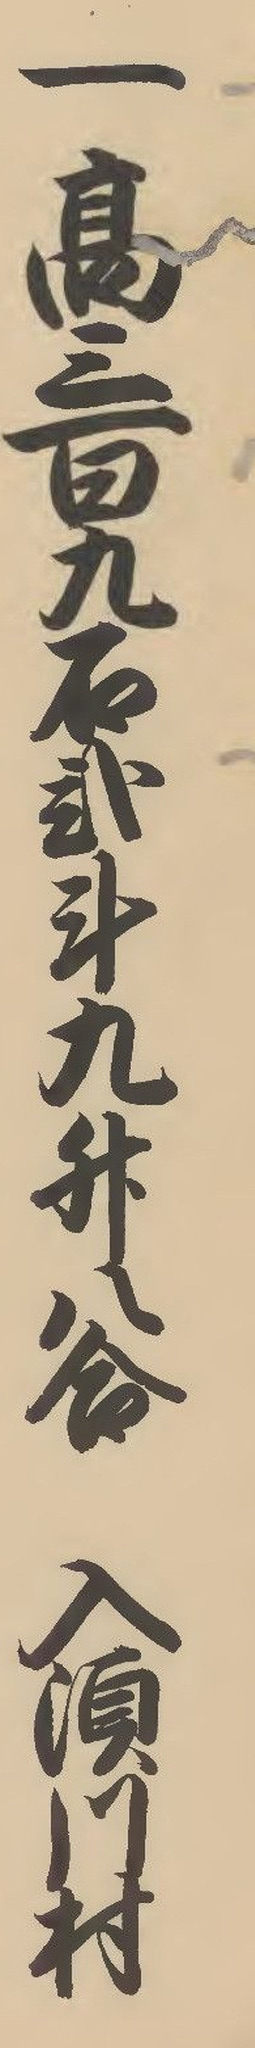一髙三百九石弐斗九升八合入須川村
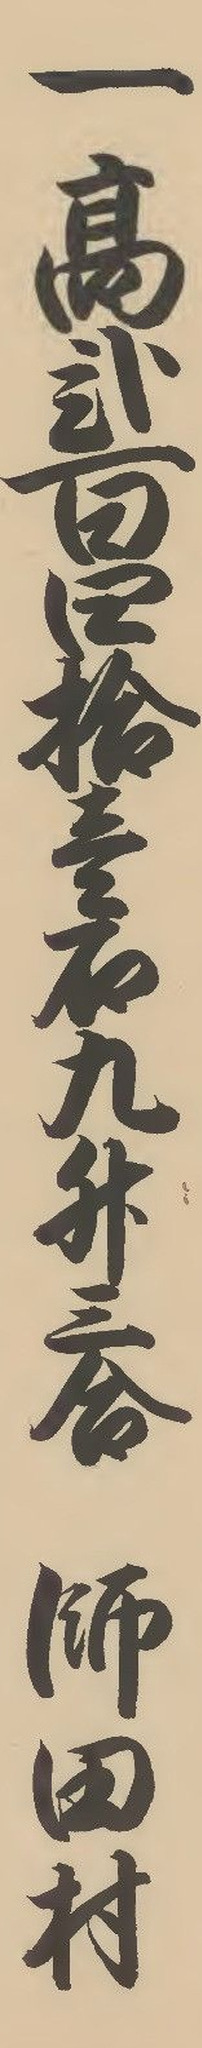一髙弐百四拾壱石九升三合師田村
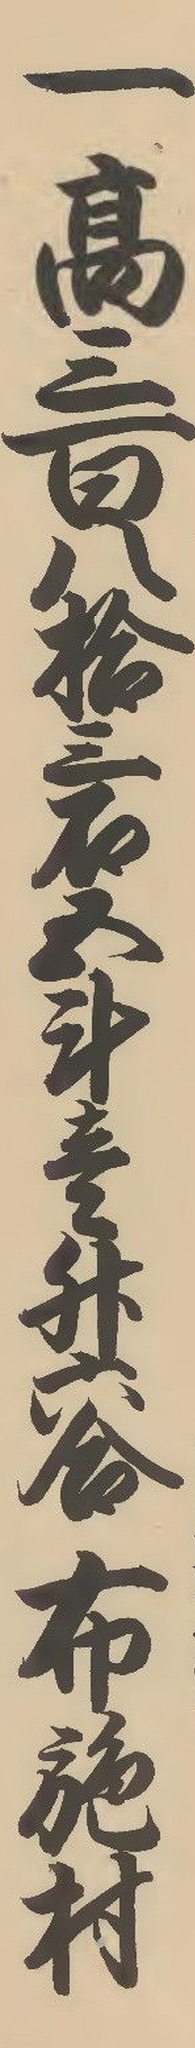一髙三百八拾三石五斗壱升六合布施村
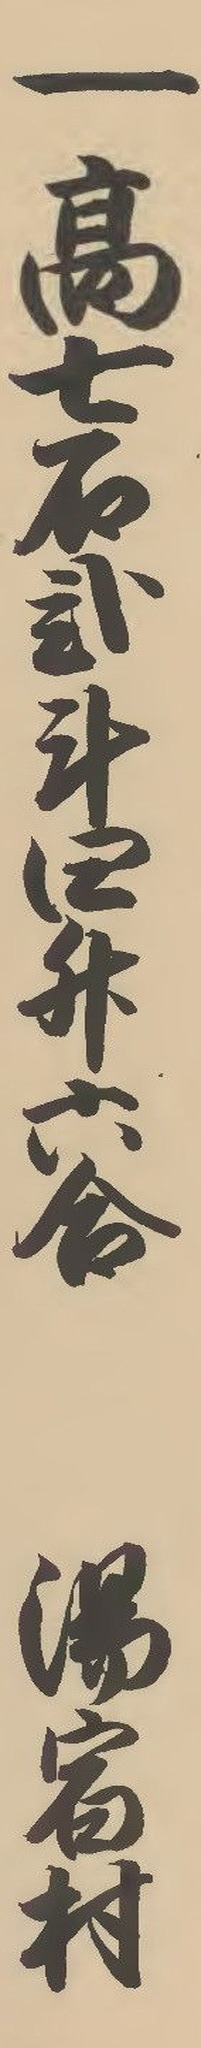一髙七石弐斗四升六合湯宿村
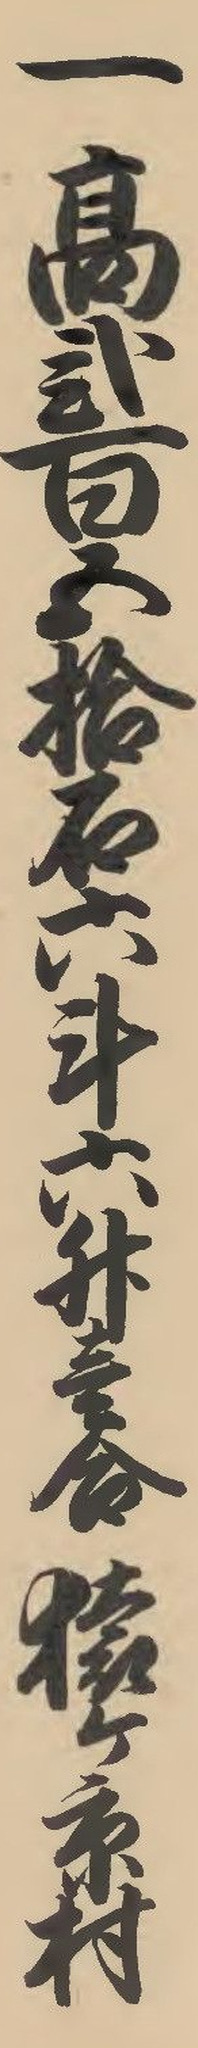一髙弐百五拾石六斗六升壱合猿ヶ京村
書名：上野国郷帳
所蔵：国立公文書館 National Archives of Japan
